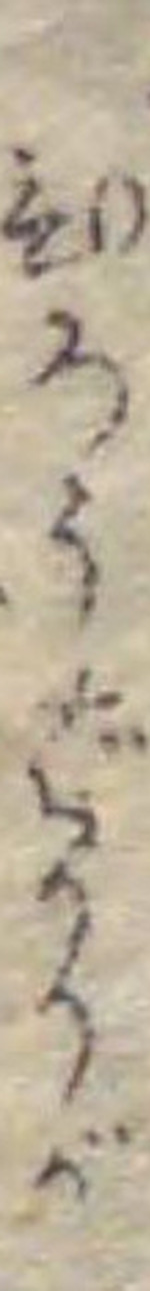ひろうばかりが
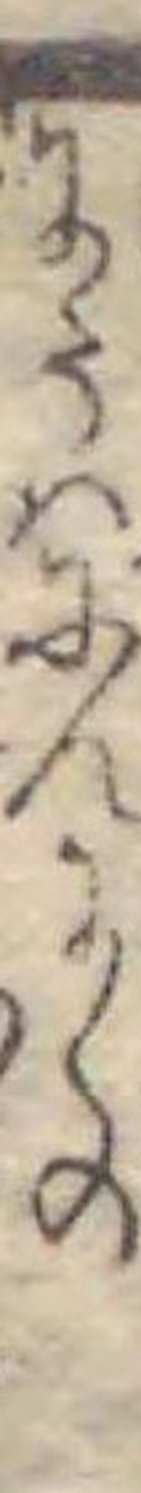にうはにんにくの
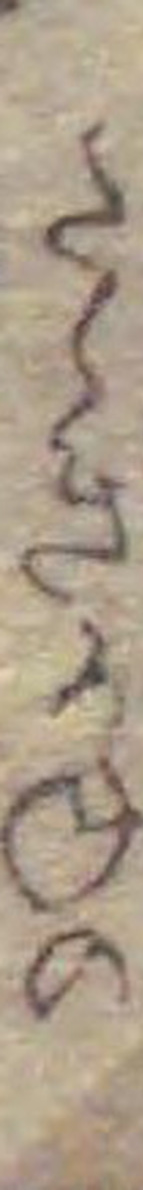たゝきかねの
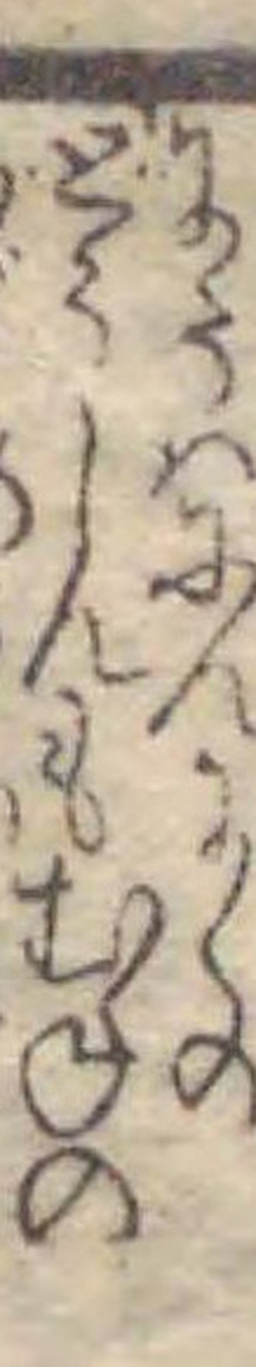どうしんもむねの
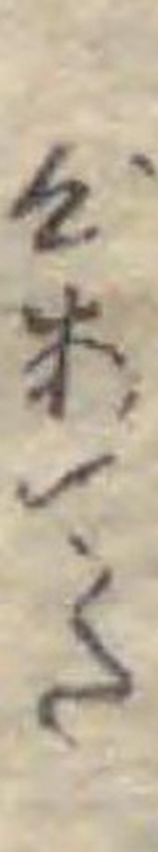心あてた
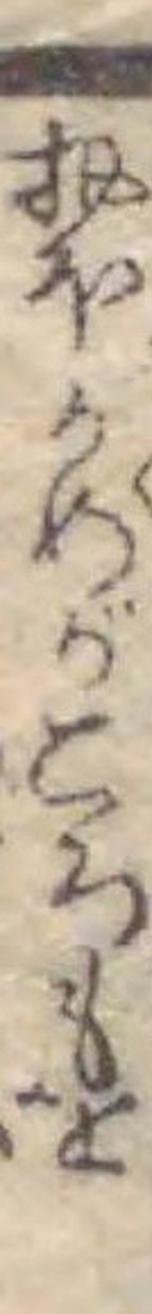おほかめがころもを
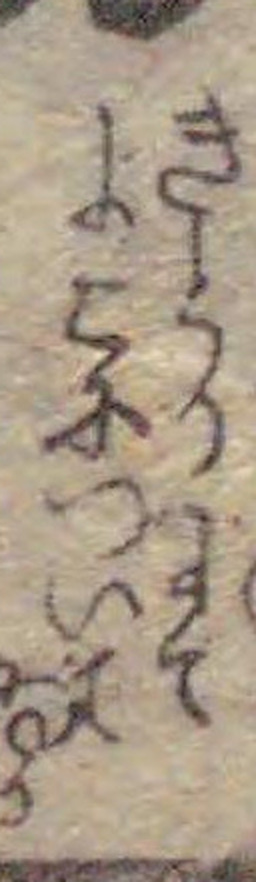よこについて
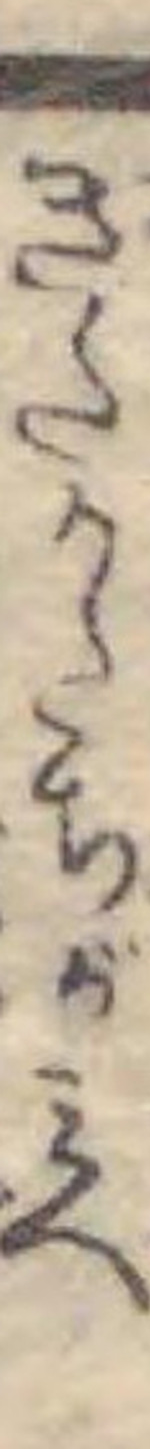きたかたちがみへ
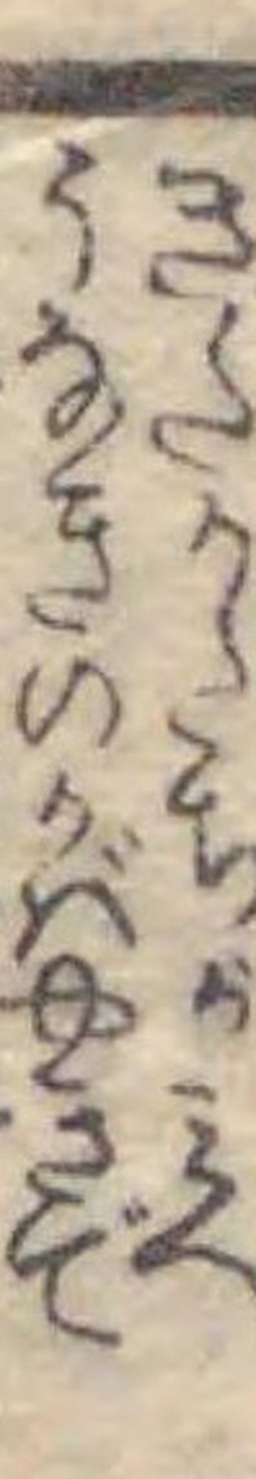うなきのかばやきで
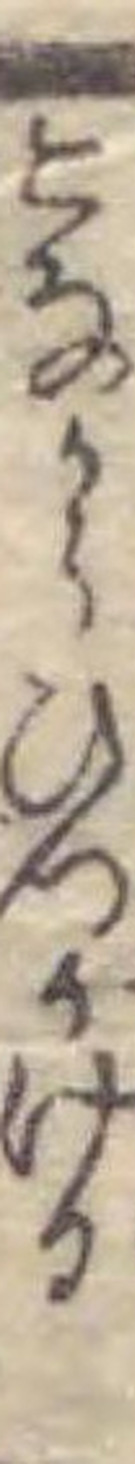こなからひつかける
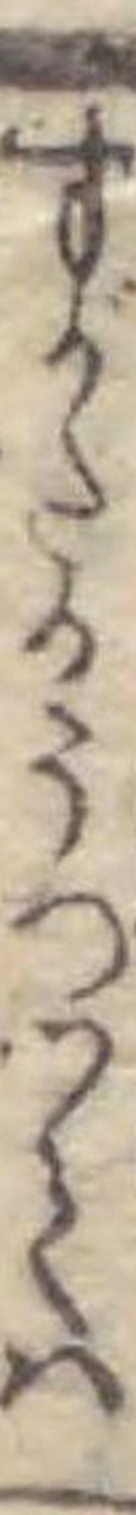すがたかうつつては
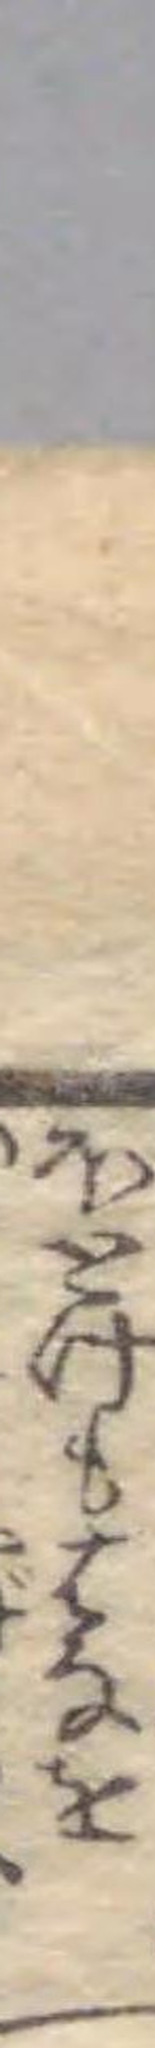ほとけもはなを
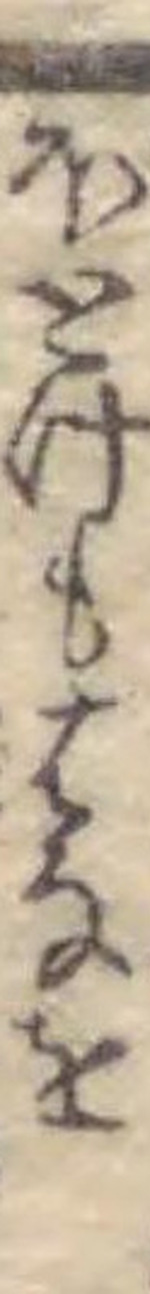ほとけもはなを
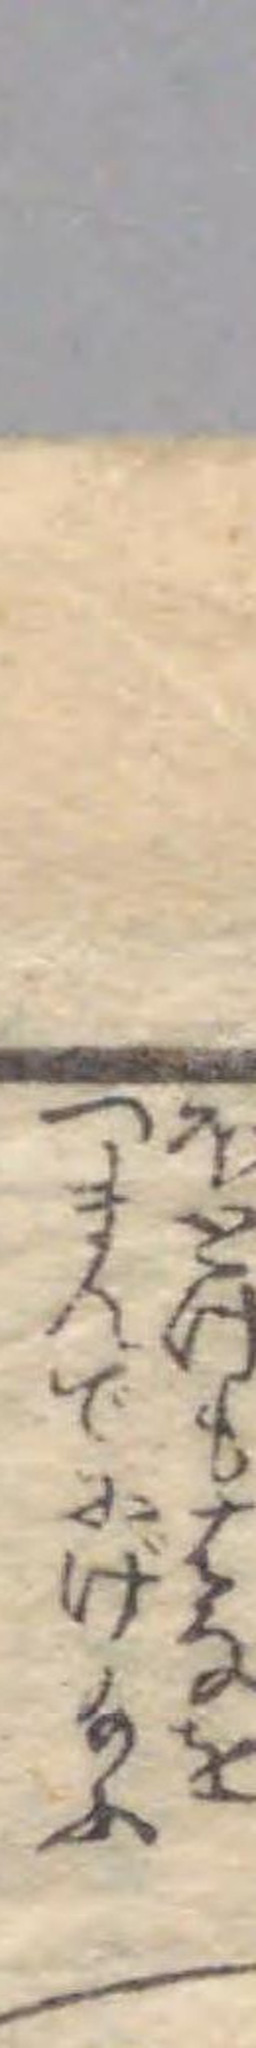つまんでにげたまふ
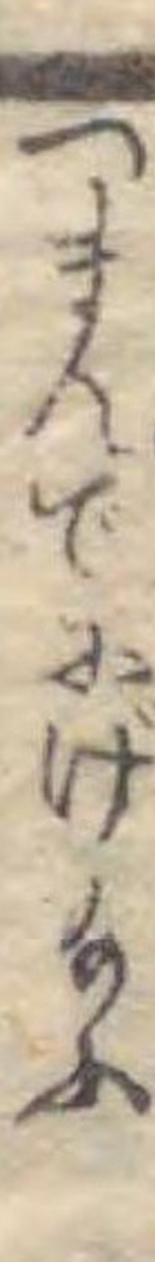つまんでにげたまふ
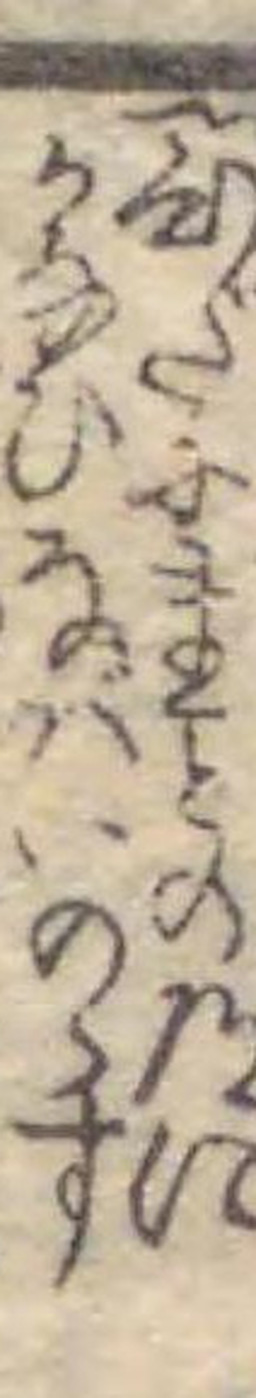かなひなばいのらす
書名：人心鏡写絵 : 3巻
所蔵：国立国会図書館 National Diet Library, JAPAN
